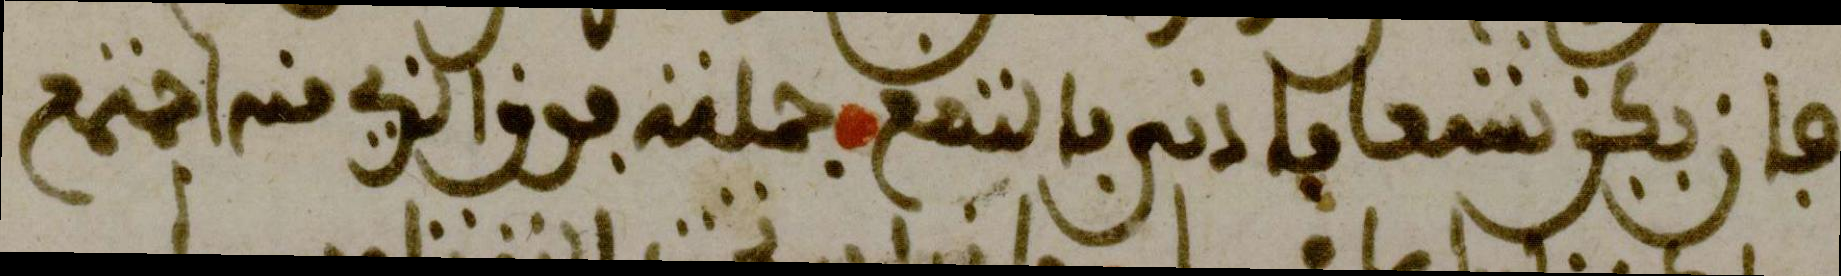فان يكن تسعا فادنى فالتضع جملته فوق الذي منه اجتمع
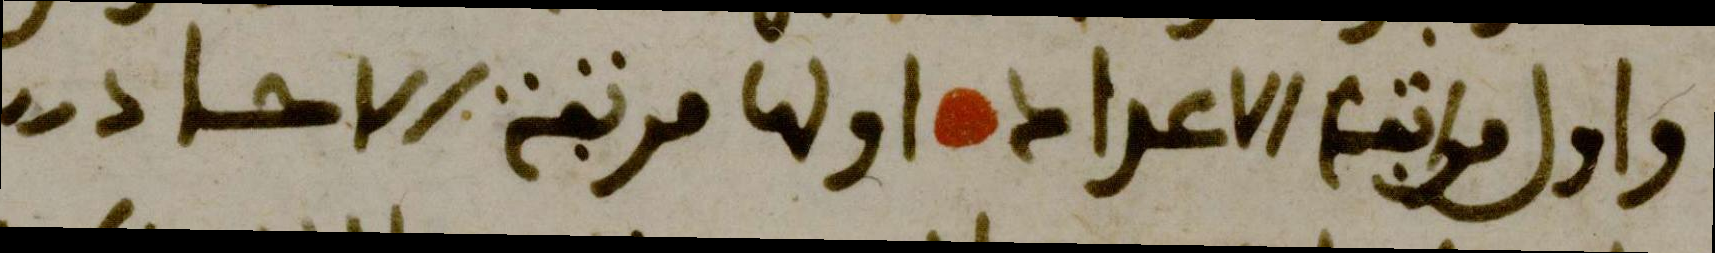واول مراتب الاعداد اولها مرتبة الاحاد
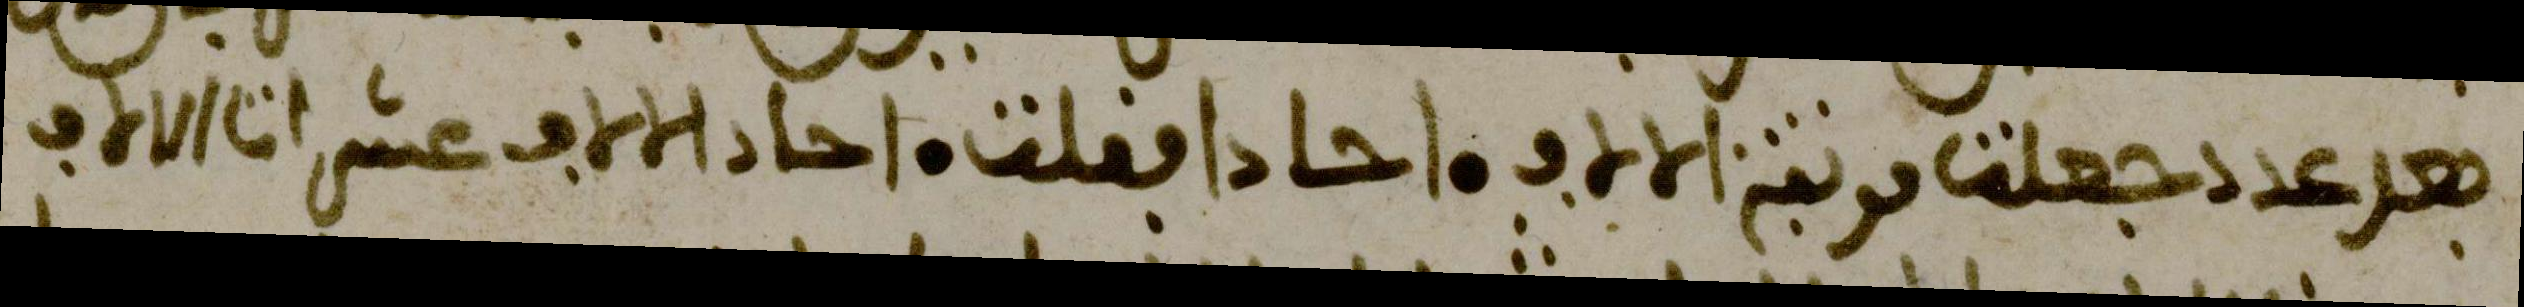بعد عدد جعلت مرتبة الالاف ءاحدا فقلتت ءاحاد الالاف عشرات الالاف
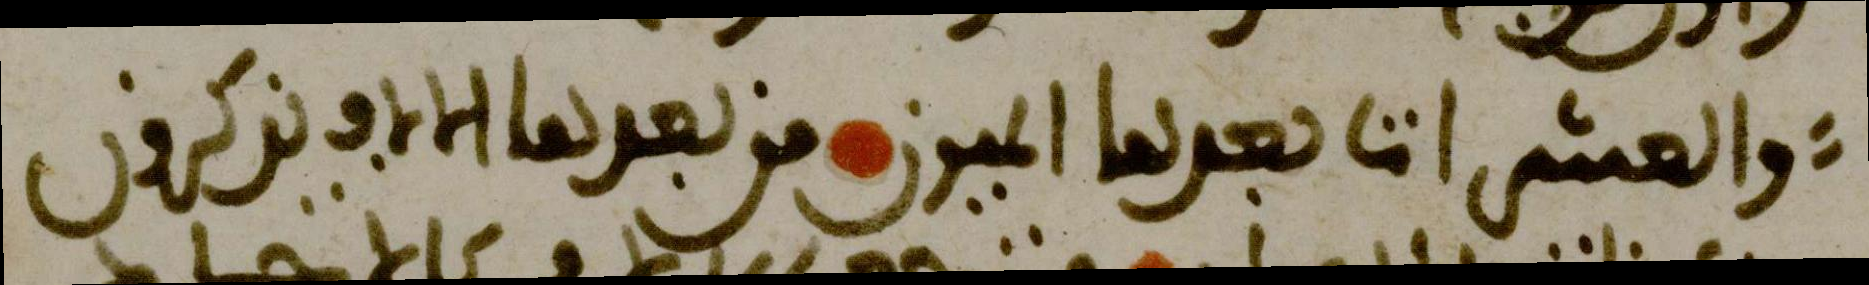العشرات بعدها الميون من بعدها الالاف يذكرون
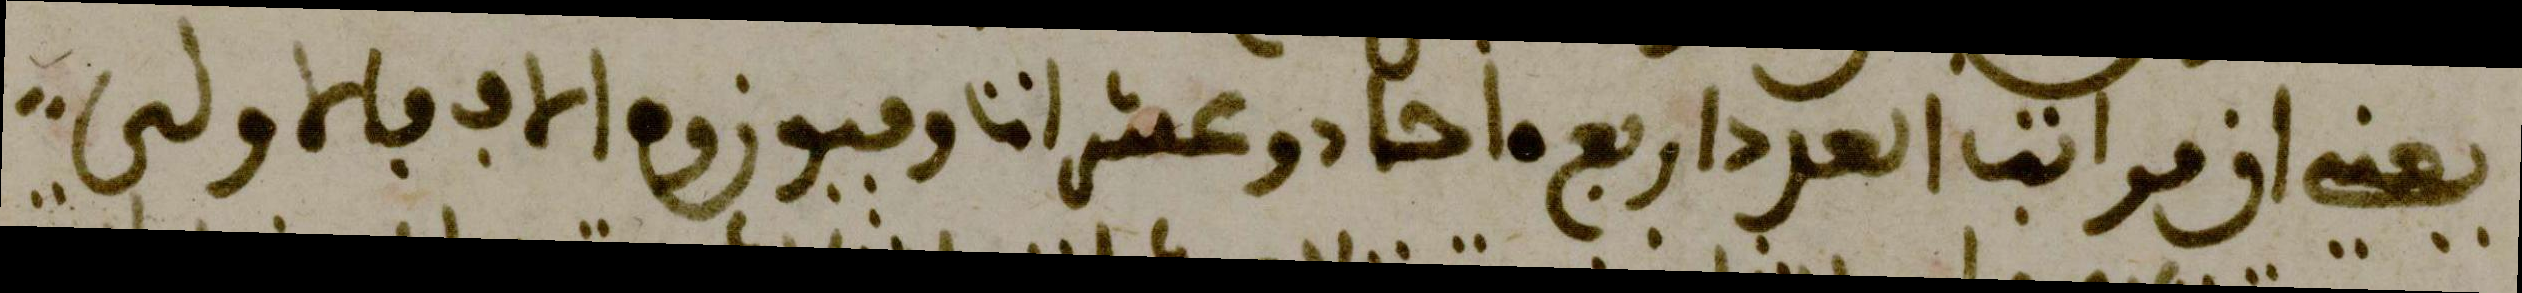يعني ان مراتب العدد اربع ءاحاد وعشرات ميون ءالاف فالاولى
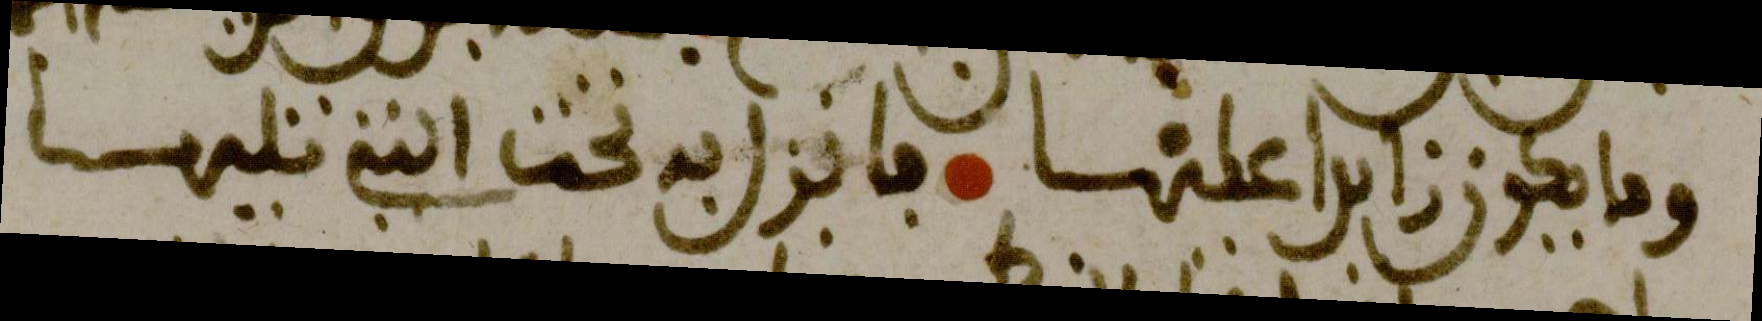وما يكون زائدا عليْها فانزل به تحت التي تليها
